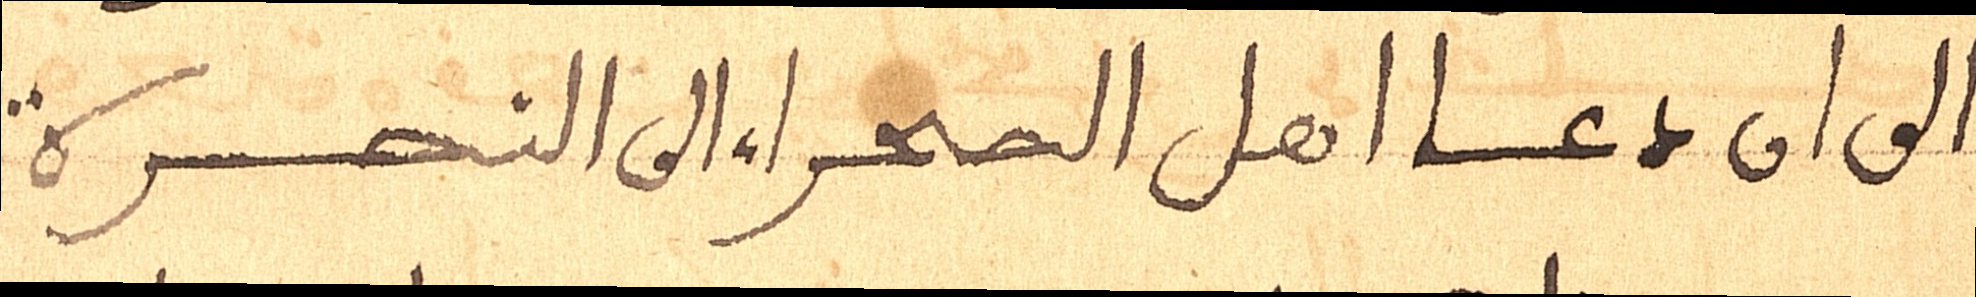الى ان دعا اهل الصحراء الى النصرة
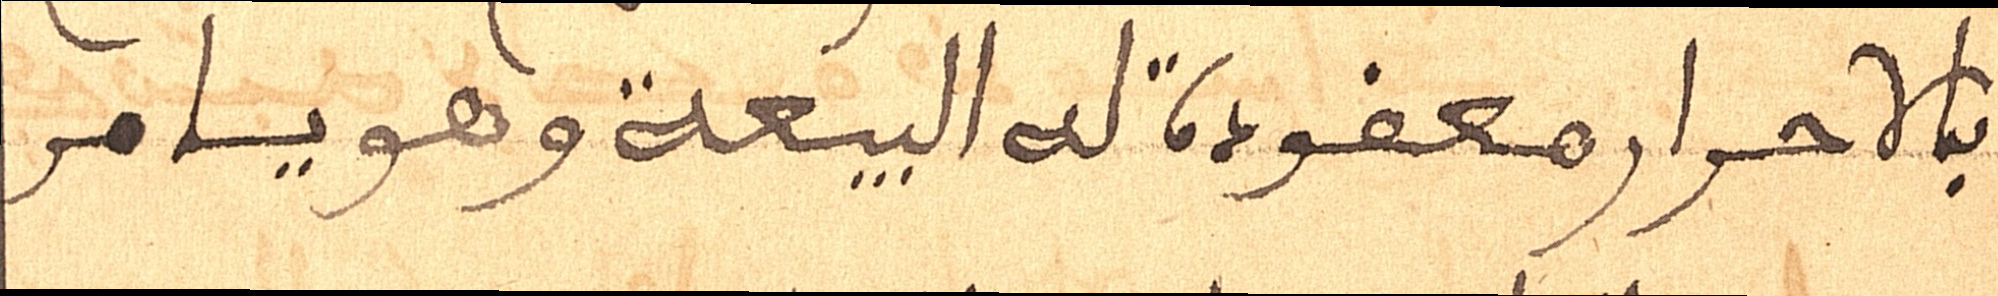بالاحرار معقودة له البيعة وهو يامر
